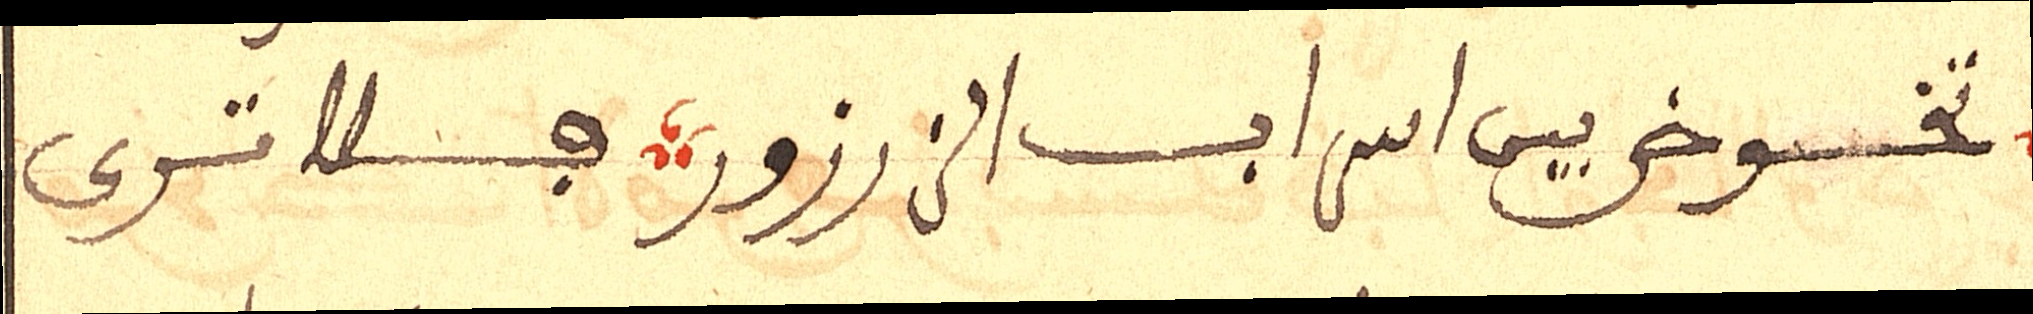تخوض بين اسراب الزرزور فلا ترى
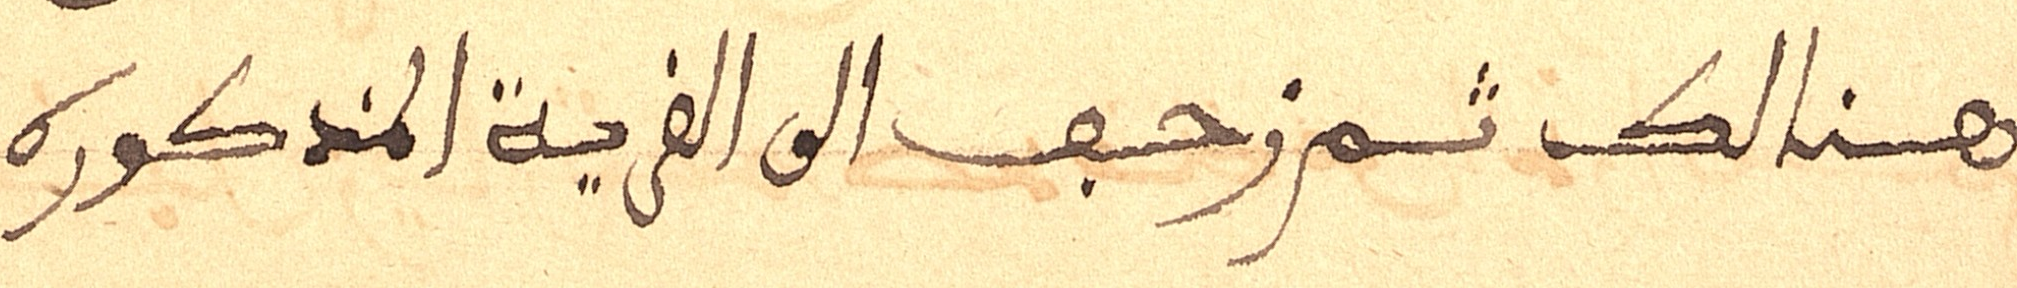هنالك ثم زحف الى القرية المذكوره
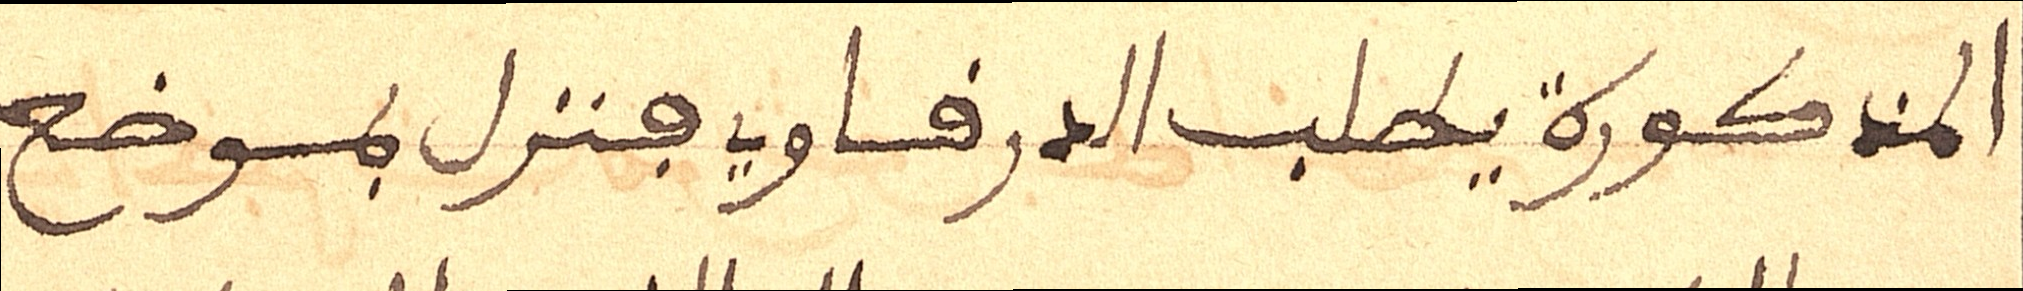المذكورة يطلب الدرقاوي فنزل بموضع
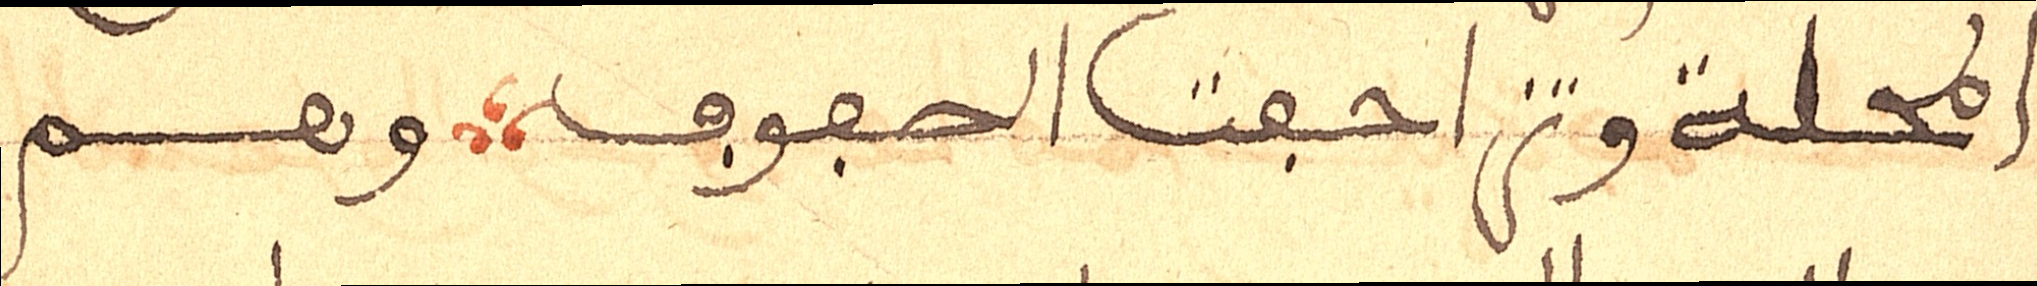المحلة وتزاحفت الصفوف وهم
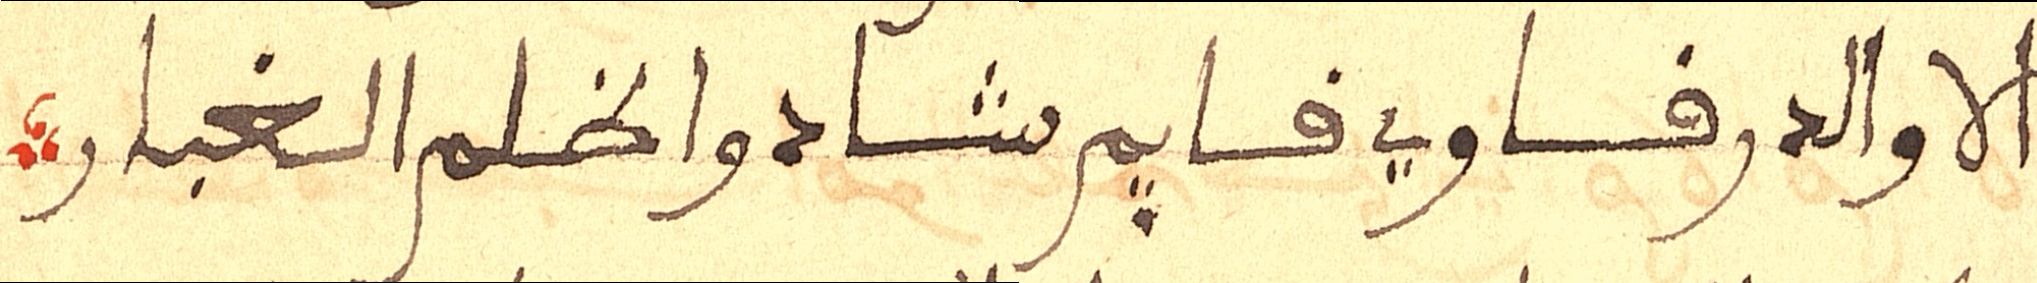الا والدرقاوي قائم شاد واظلم الغبار
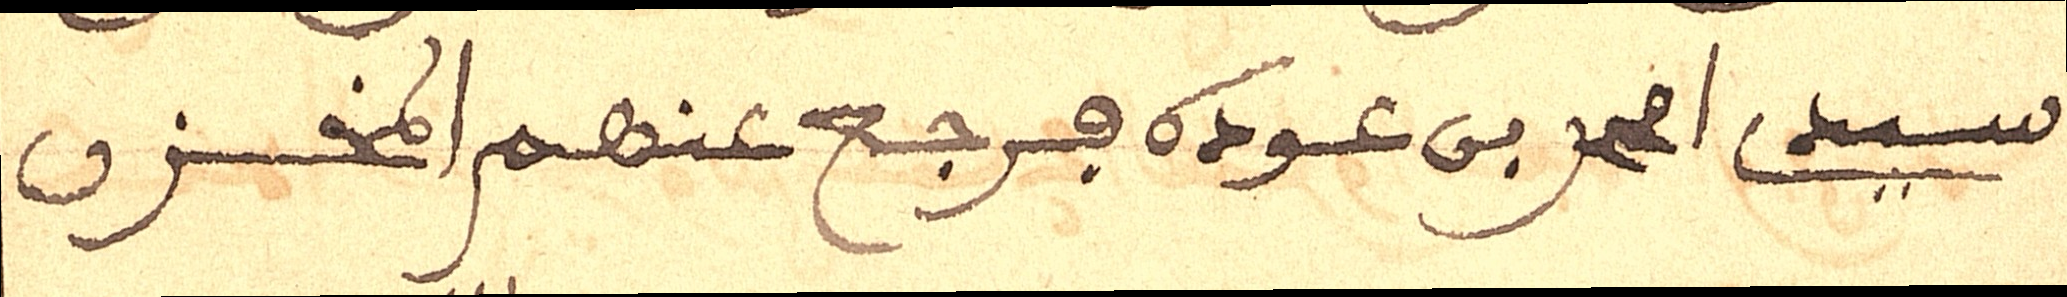سيدى ا محمد بن عوده فرجع عنهم المخزن
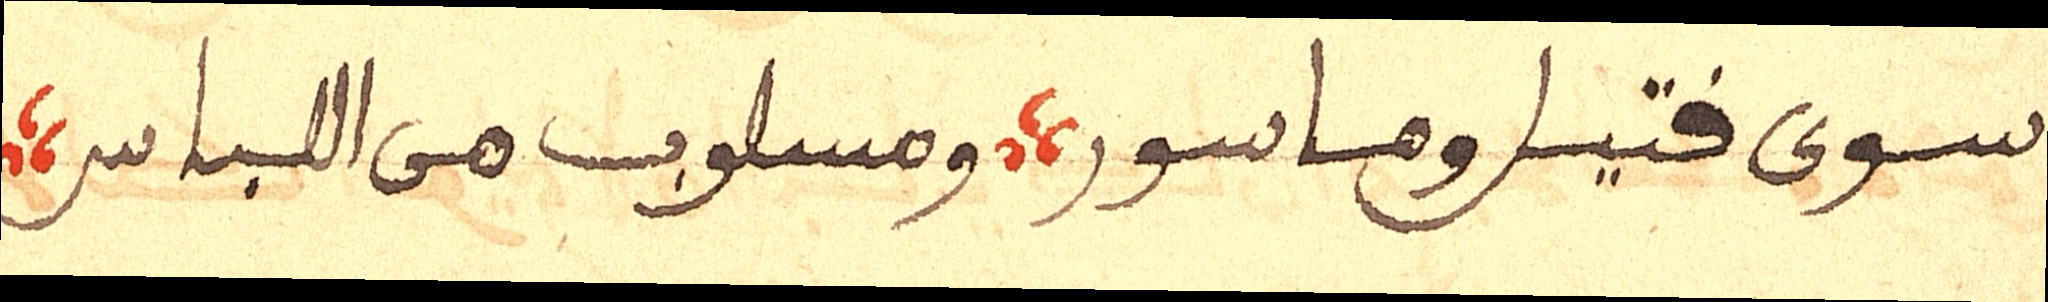سوى قتيل وماسور ومسلوب من اللباس
